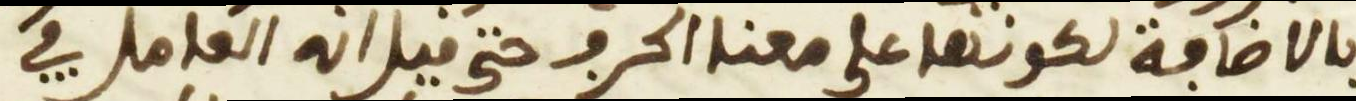بالاضافة لكونها على معنا الحرف حتى قيل انه العامل في
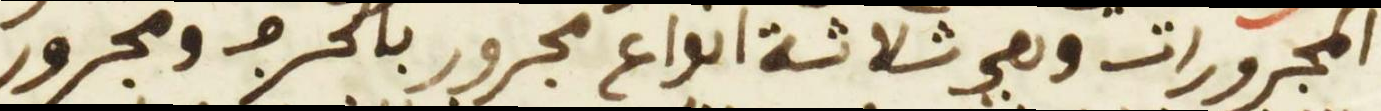المجرورات وهي ثلاثة انواع مجرور بالحرف ومجرور
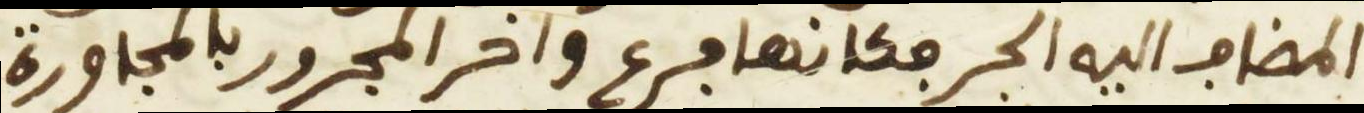المضاف اليه الجر فكانها فرع واخر المجرور بالمجاورة
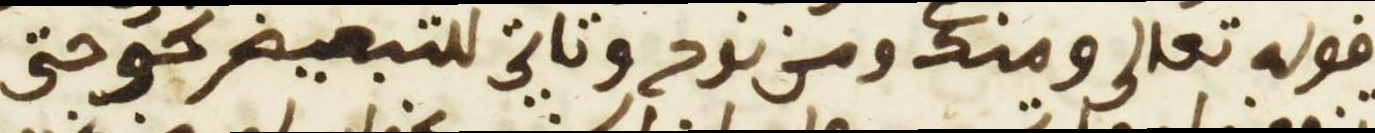قوله تعالى ومنك ومن نوح وتاتي للتبعيض نحو حتى
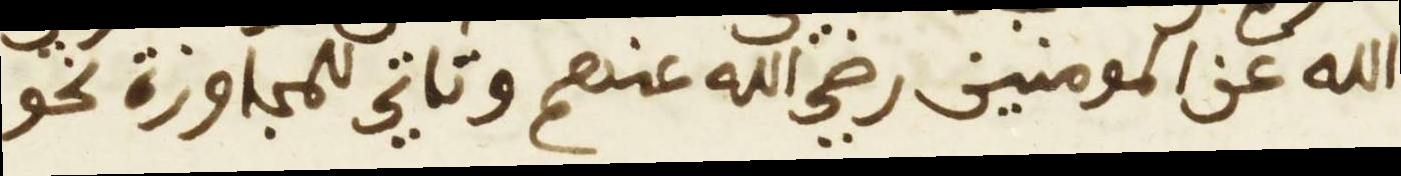الله عن المومنين رضي الله عنهم وتاتي للمجاوزة نحو
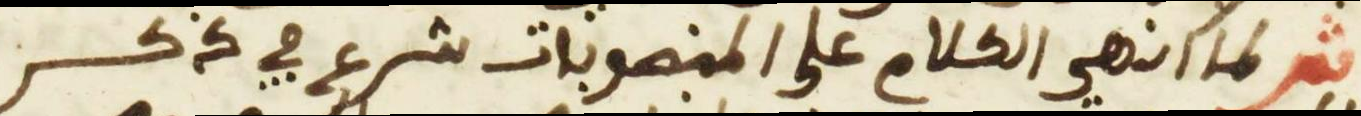ش لما انهي الكلام على المنصوبات شرع في ذكر
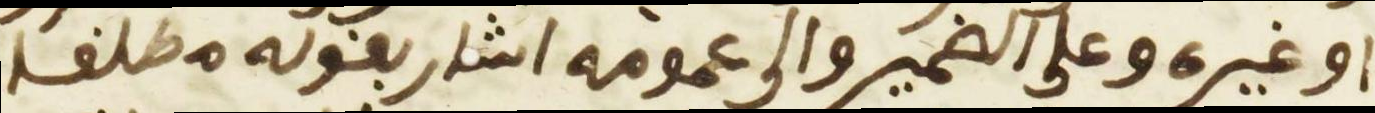او غيره وعلى الضمير والى عمومه اشار بقوله مطلقا
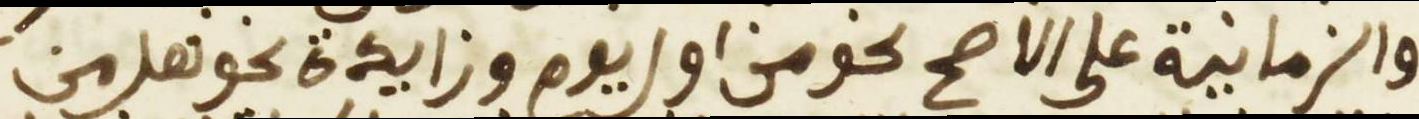والزمانية على الاصح نحو من اول يوم وزايدة نحو هل من
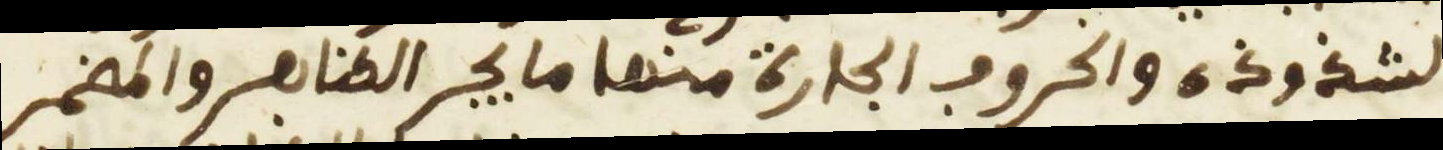لشذوذه و الحروف الجارة منها ما يجر الظاهروالمضمر
